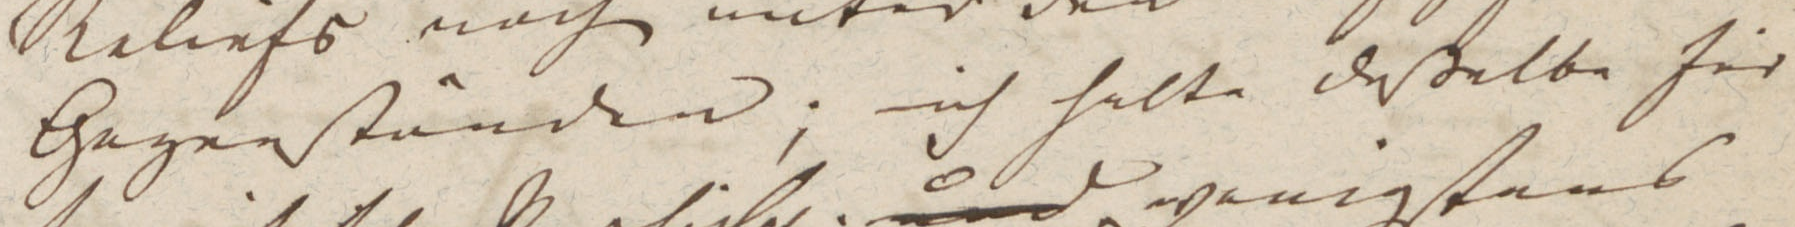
Gegenständen; ich halte dasselbe für
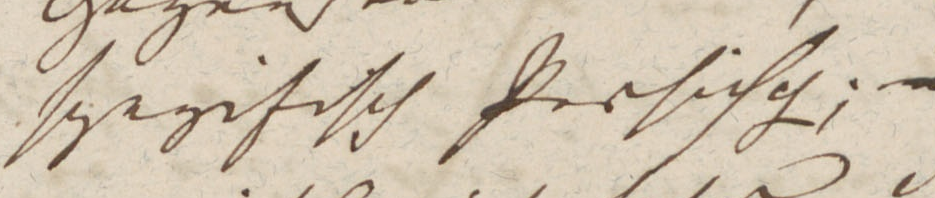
spezifisch Persisch;
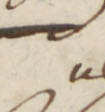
und
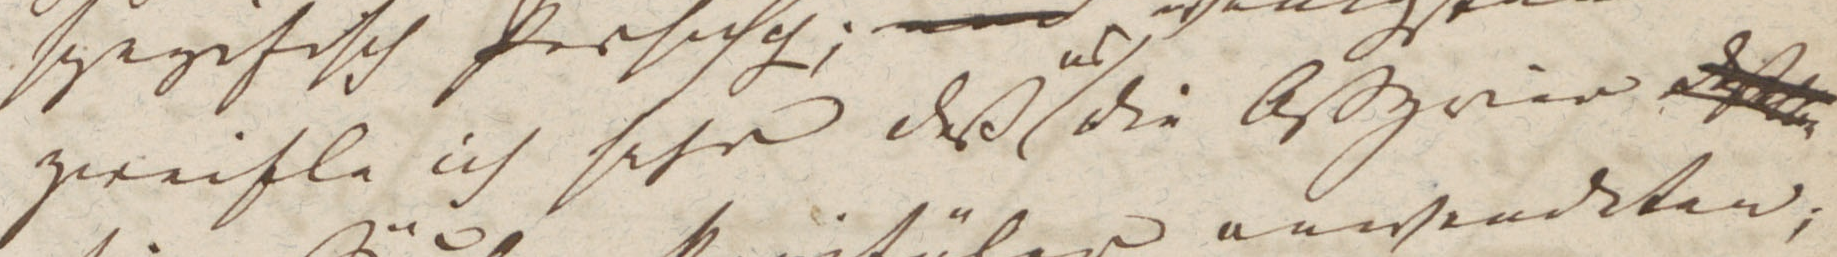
zweifle ich sehr dass es die Assyrier dasselbe
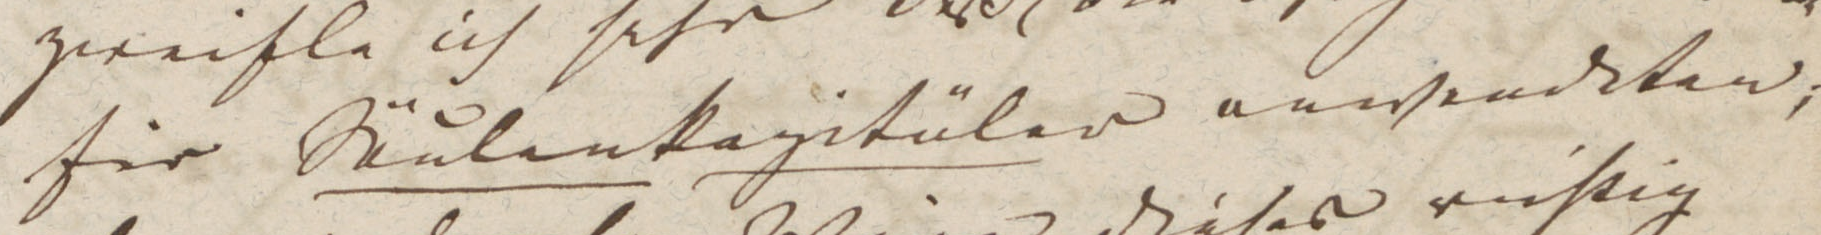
für Säulenkapitäler anwendeten;
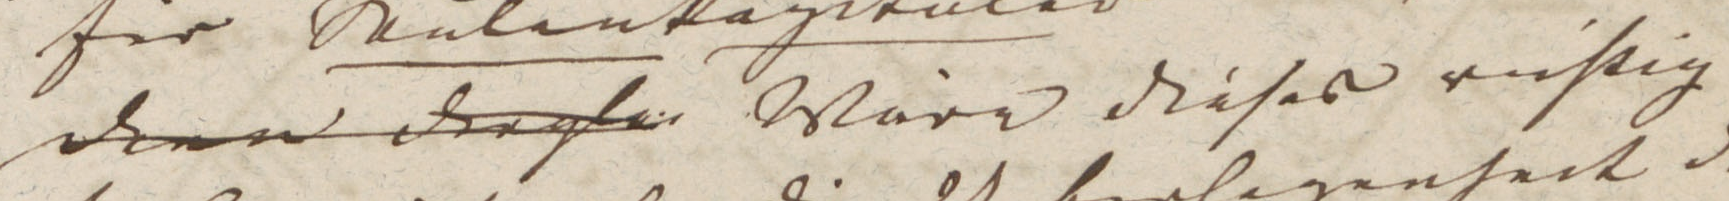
Denn derglei Wäre dieses richtig
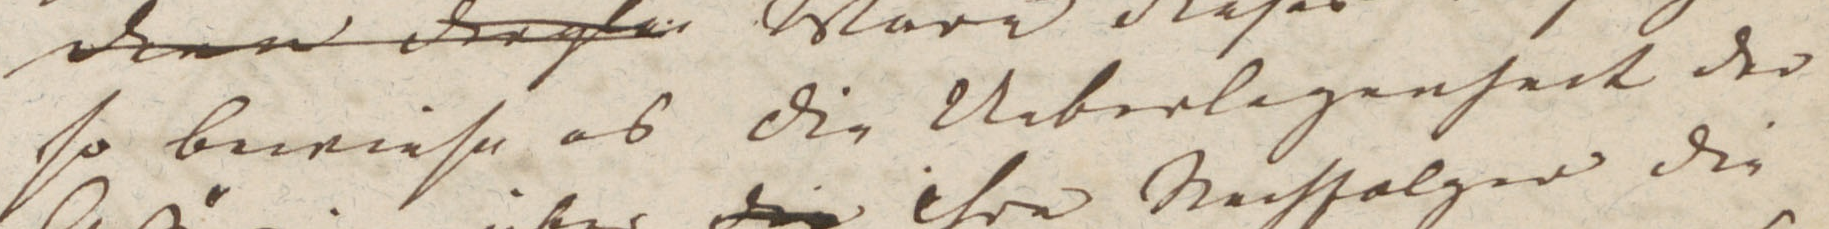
so bewiese es die Ueberlegenheit der
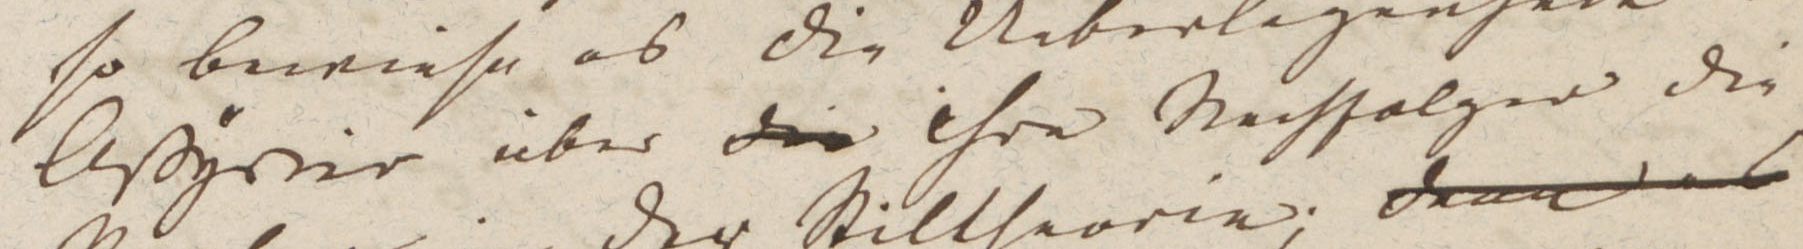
Assyrier über die ihre Nachfolger die
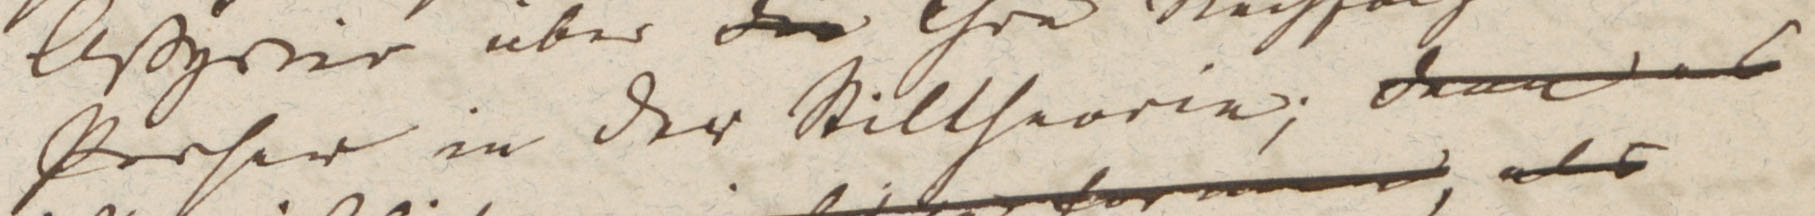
Perser in der Stiltheorie; denn es
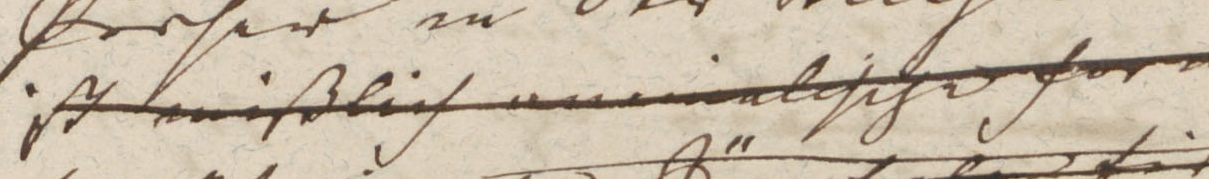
ist misslich animalische Formen,
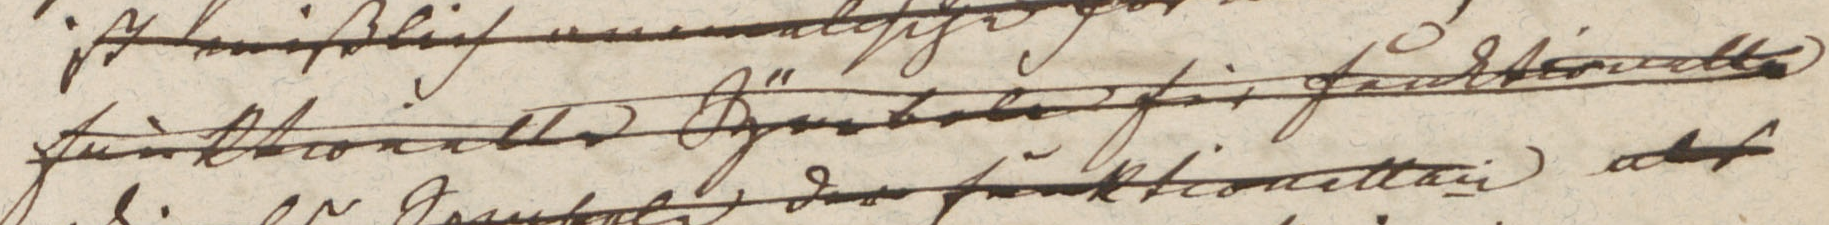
funktionelle Symbole für funktionelle
